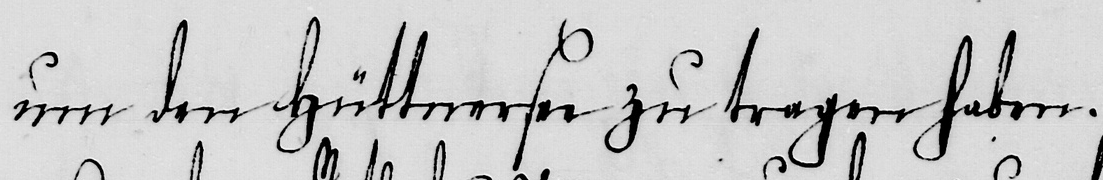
um den Hüttensee zu tragen haben.
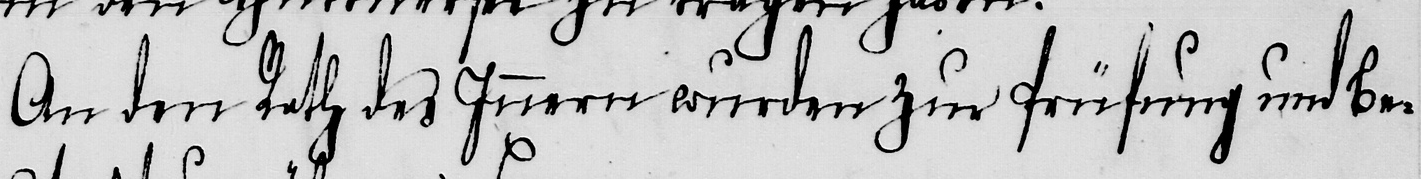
An den Rath des Innern wurden zur Prüfung und Be¬
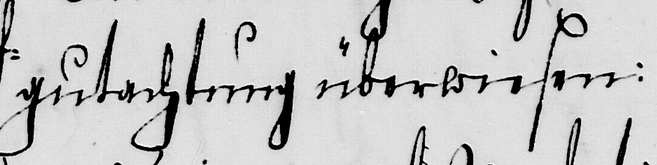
gutachtung überwiesen:
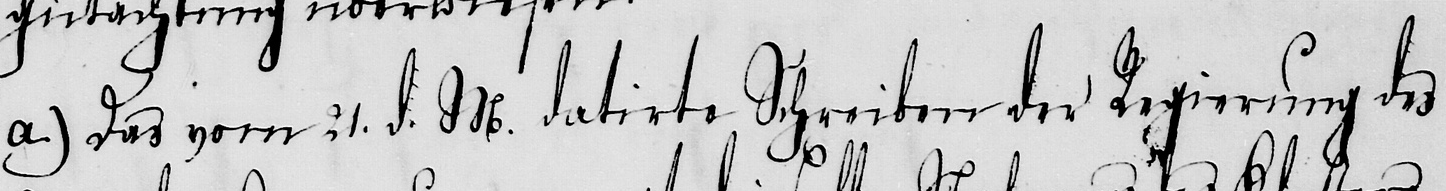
a.) Das vom 21. d. M. datirte Schreiben der Regierung des
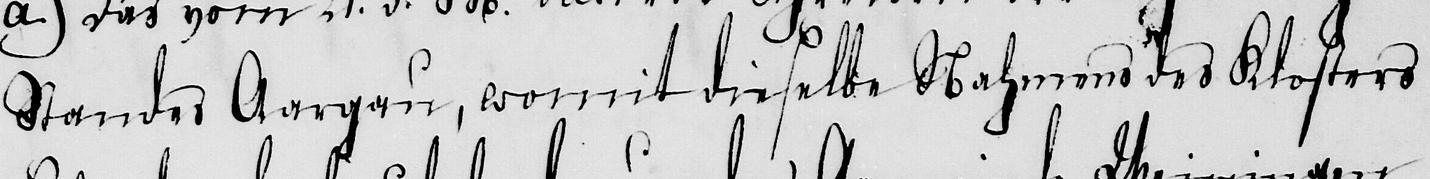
Standes Aargau, womit dieselbe Nahmens des Klosters
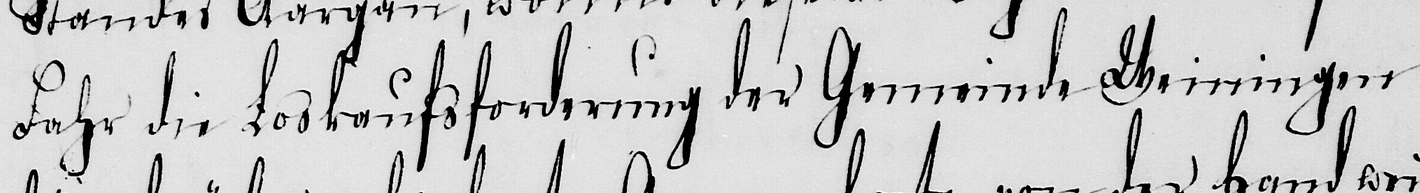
Fahr die Loskaufsforderung der Gemeinde Weiningen
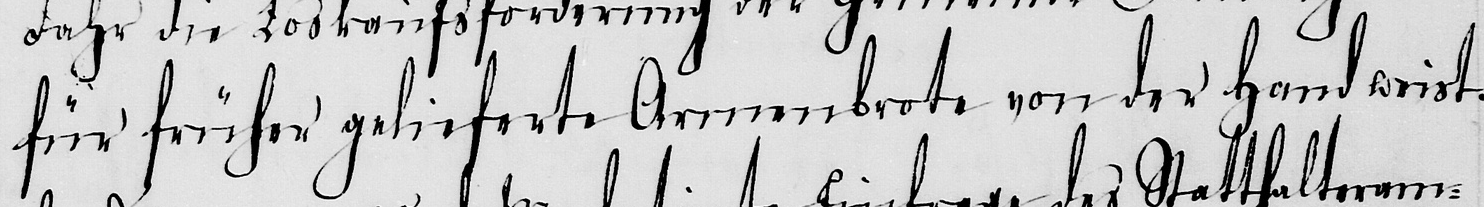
für früher gelieferte Armenbrote von der Hand weist.
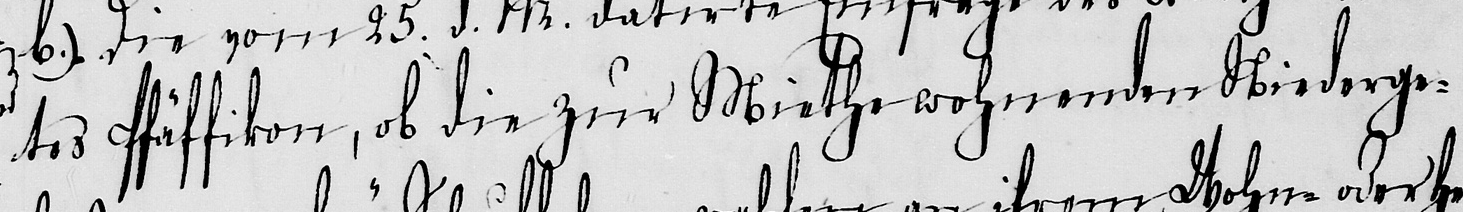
tes Pfäffikon, ob die zur Miethe wohnenden Niederge¬
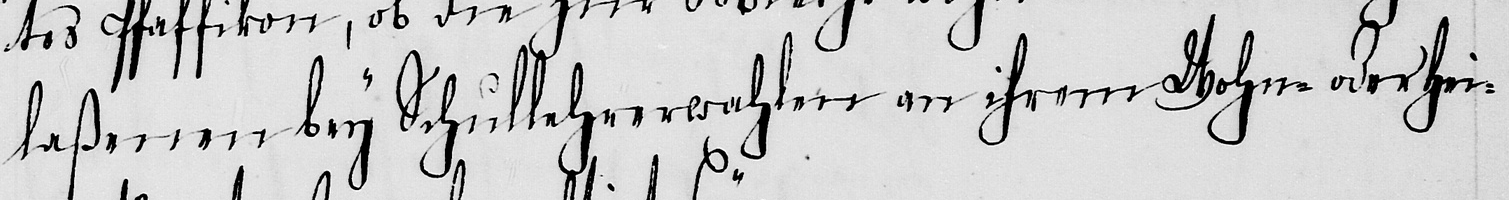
laßenen bey Schullehrerwahlen an ihrem Wohn- oder Hei¬
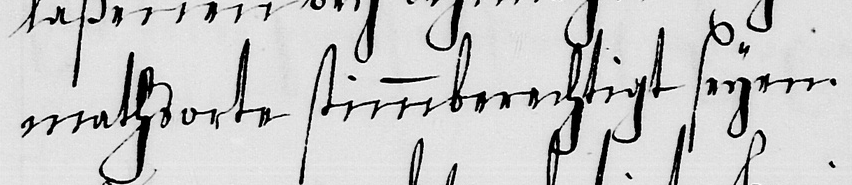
mathsorte stimmberechtigt seyen.
